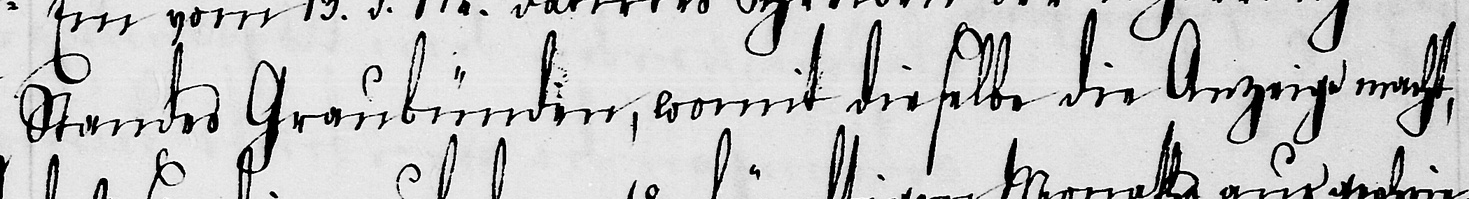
Standes Graubünden, womit dieselbe die Anzeige mach¬
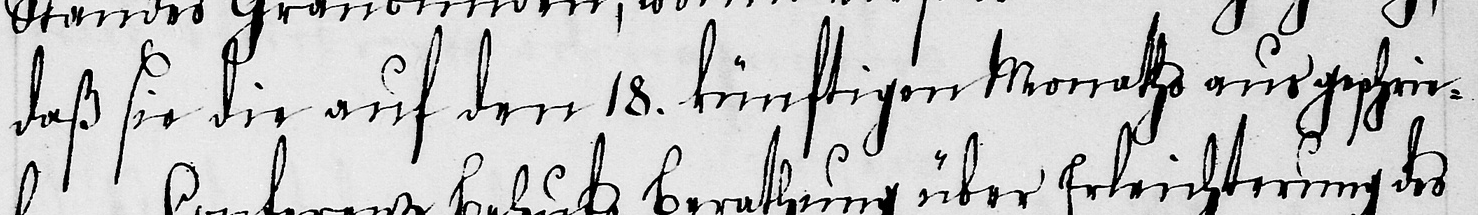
daß sie die auf den 18. künftigen Monaths ausgerie¬
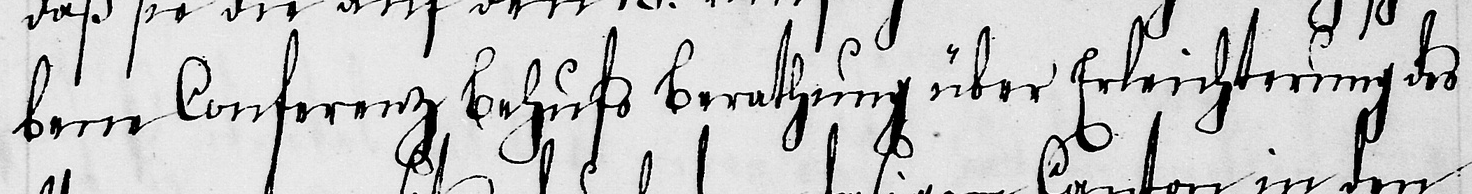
bene Conferenz Behufs Berathung über Erleichterung des
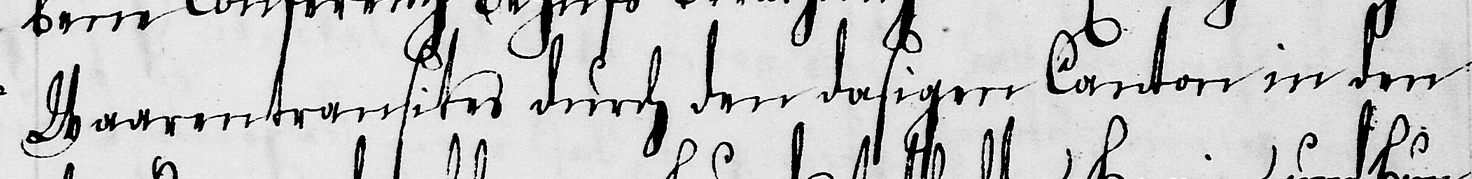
Waarentransites durch den dasigen Canton in den
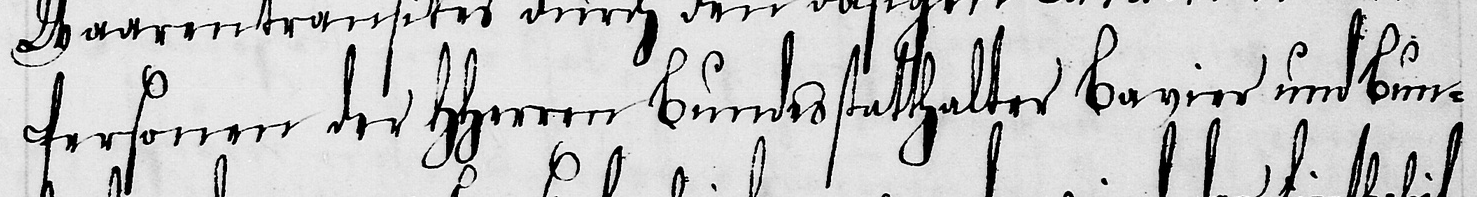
Personen der HHerren Bundesstatthalter Bavier und Bun¬
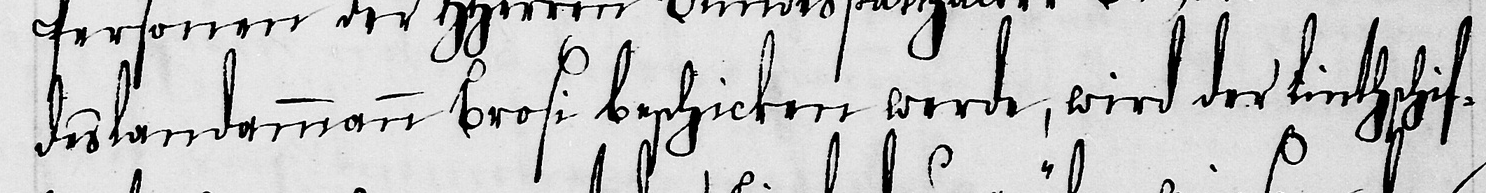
deslandamann Brosi beschicken werde, wird der Linthschi¬
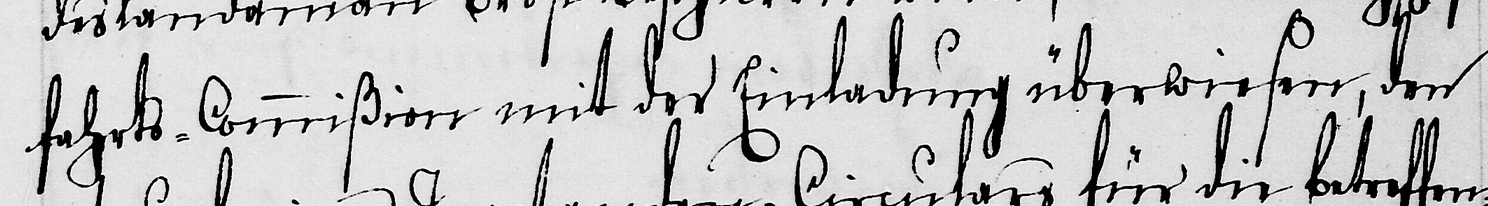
fahrts-Commißion mit der Einladung überwiesen, den
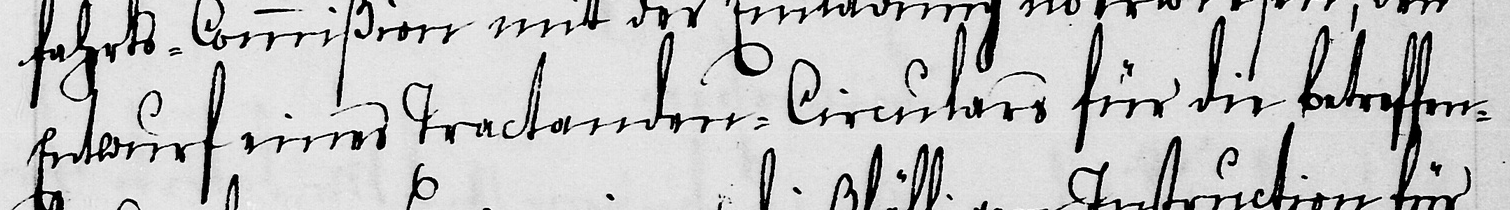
Entwurf eines Tractanden-Circulars für die betreffe¬
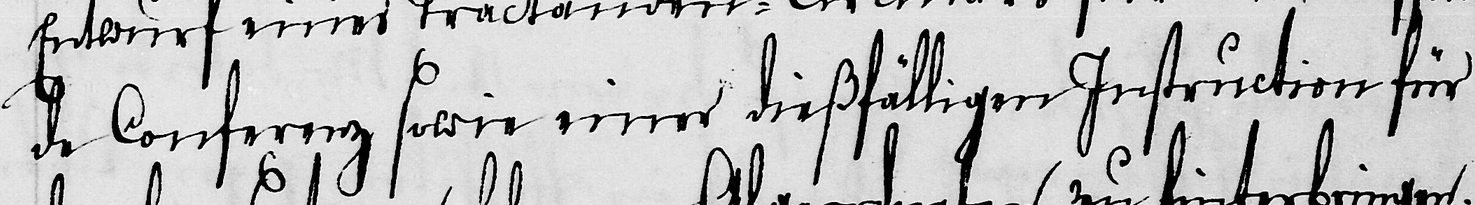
nde Conferenz sowie einer dießfälligen Instruction für
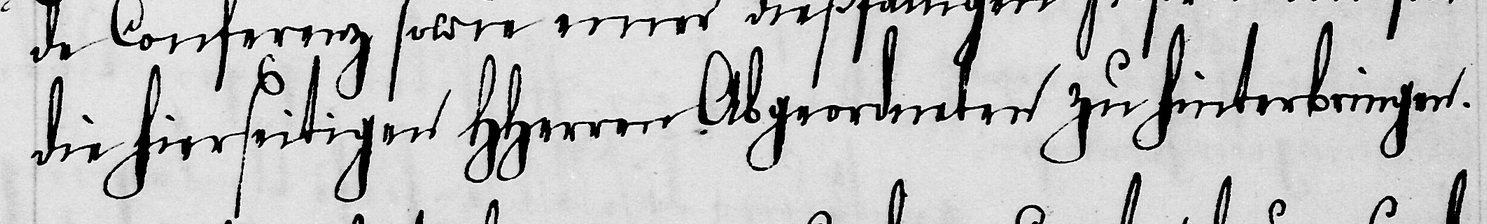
die hierseitigen HHerren Abgeordneten zu hinterbringen.
